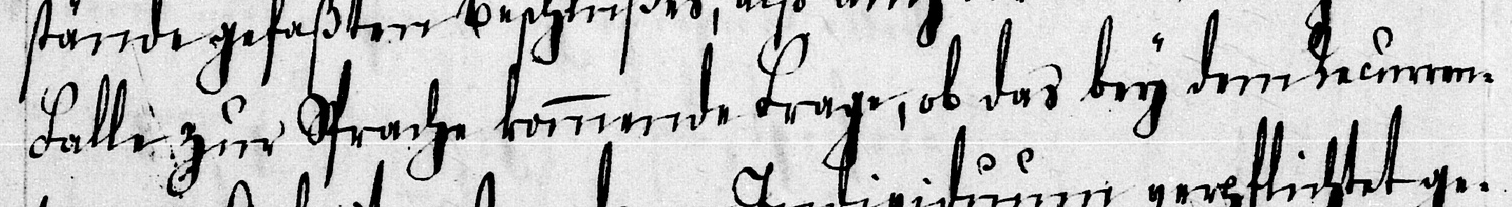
Falle zur Sprache kommende Frage, ob das bey dem Recurren¬
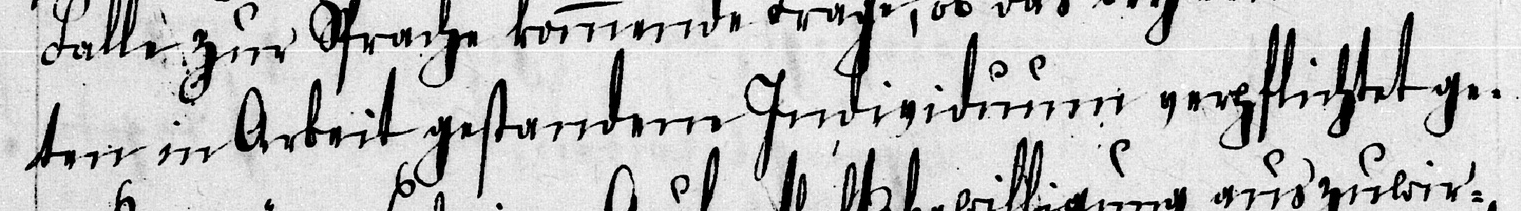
ten in Arbeit gestandene Individuum verpflichtet ge¬
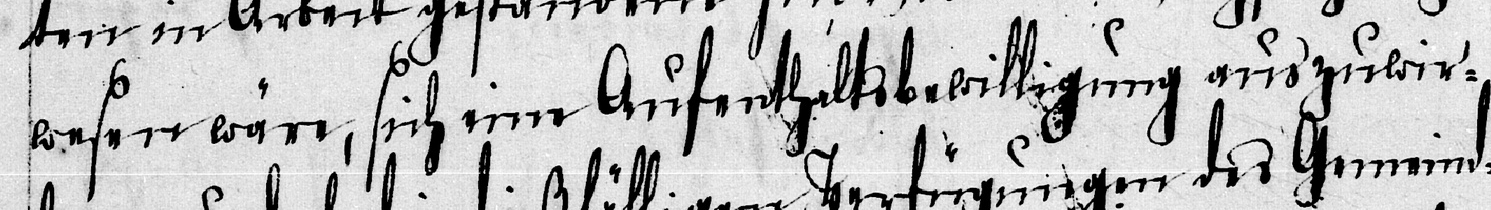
wesen wäre, sich eine Aufenthaltsbewilligung auszuwir¬
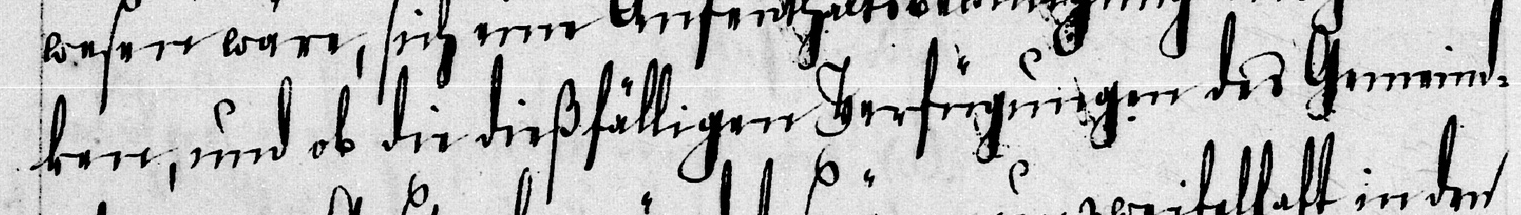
ken, und ob die dießfälligen Verfügungen des Gemeind¬
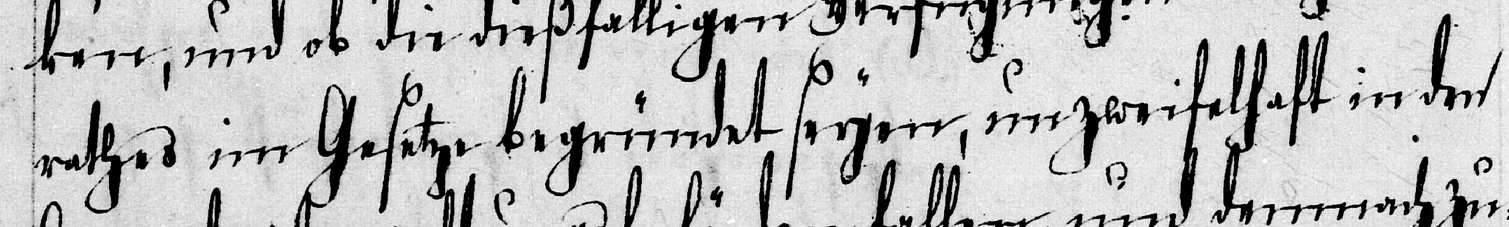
rathes im Gesetze begründet seyen, unzweifelhaft in den
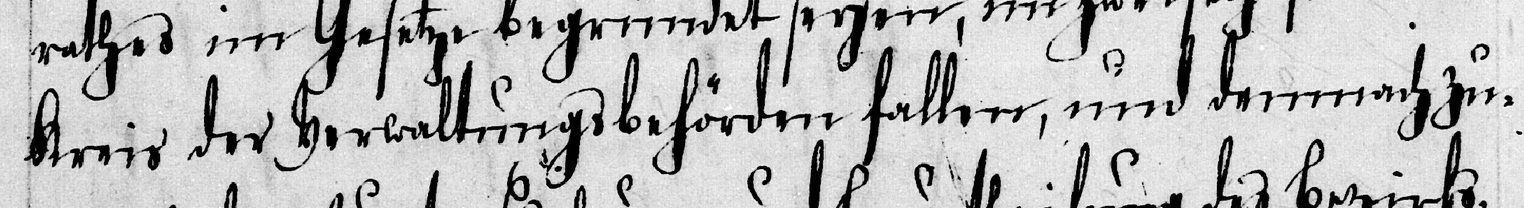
Kreis der Verwaltungsbehörden fallen, und demnach zu¬
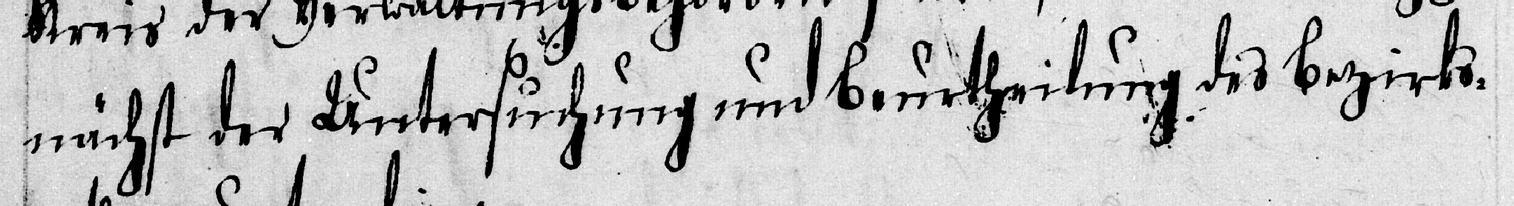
nächst der Untersuchung und Beurtheilung des Bezirks¬
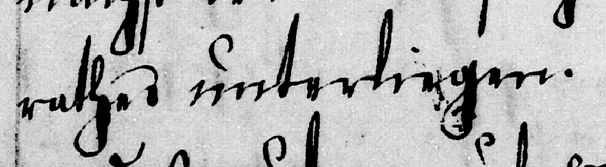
rathes unterliegen.
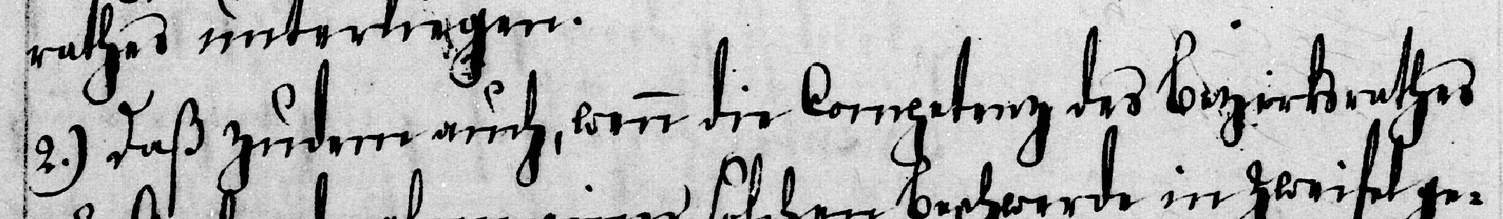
2.) Daß zudem auch, wenn die Competenz des Bezirksrathes
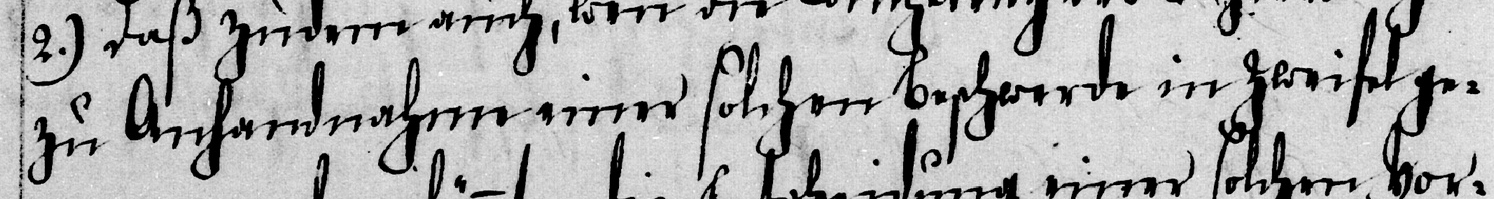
zu Anhandnahme einer solchen Beschwerde in Zweifel ge¬
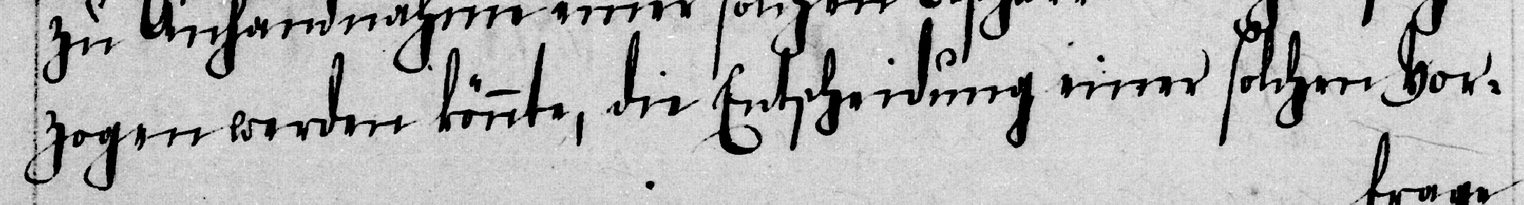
zogen werden könnte, die Entscheidung einer solchen Vor-
